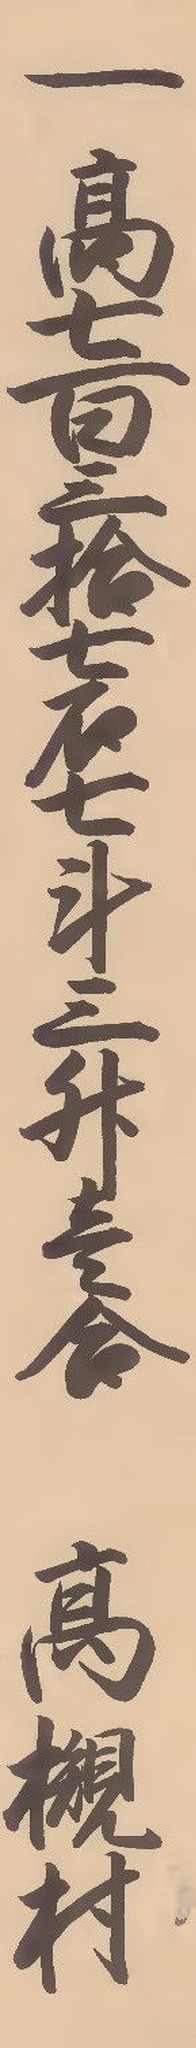一髙七百三拾七石七斗三升壱合髙槻村
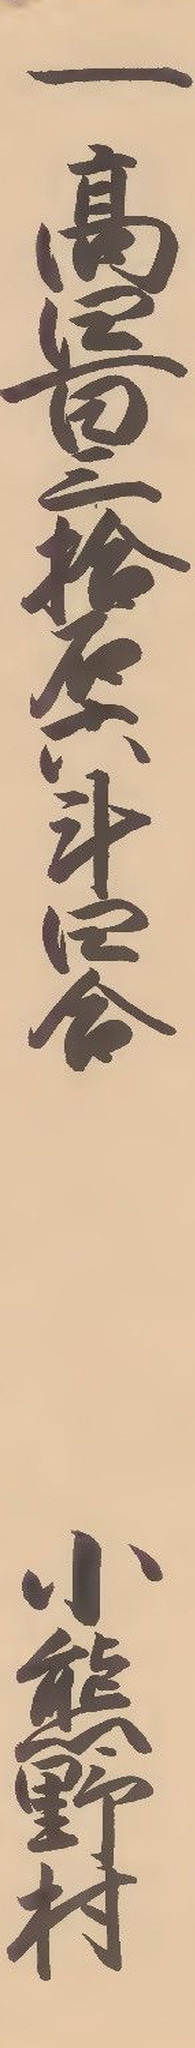一髙四百三拾石六斗四合小熊野村
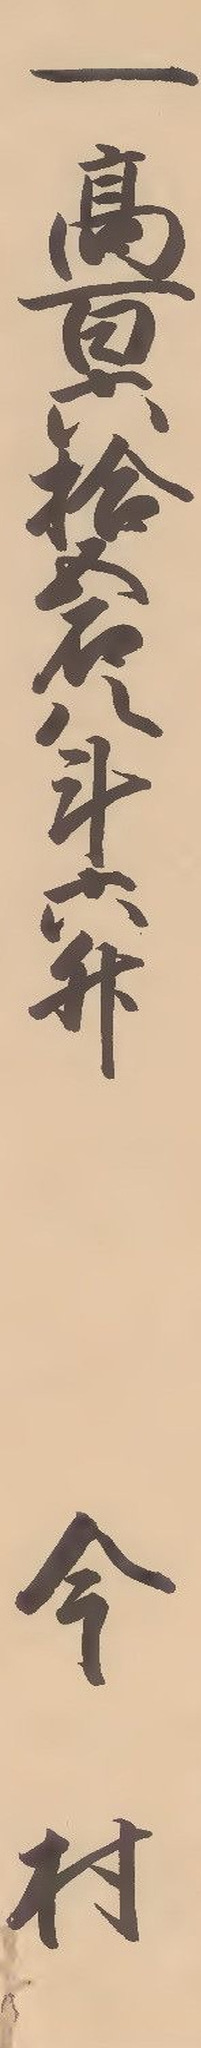一髙百六拾五石八斗六升今村
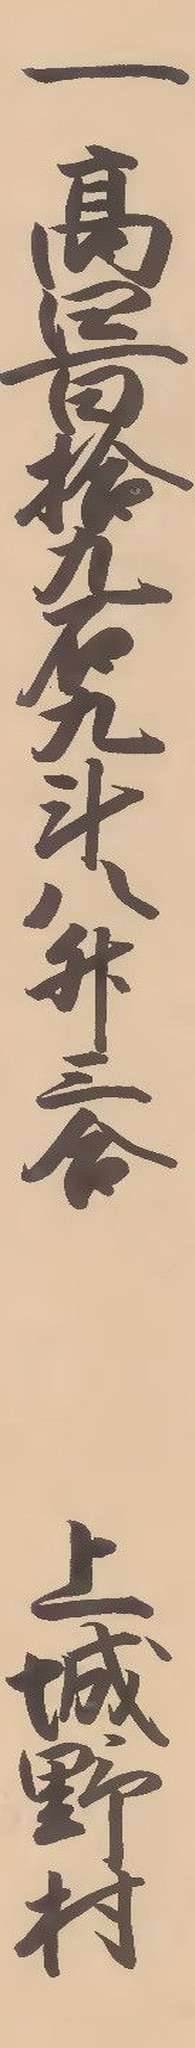一髙四百拾九石九斗八升三合上城野村
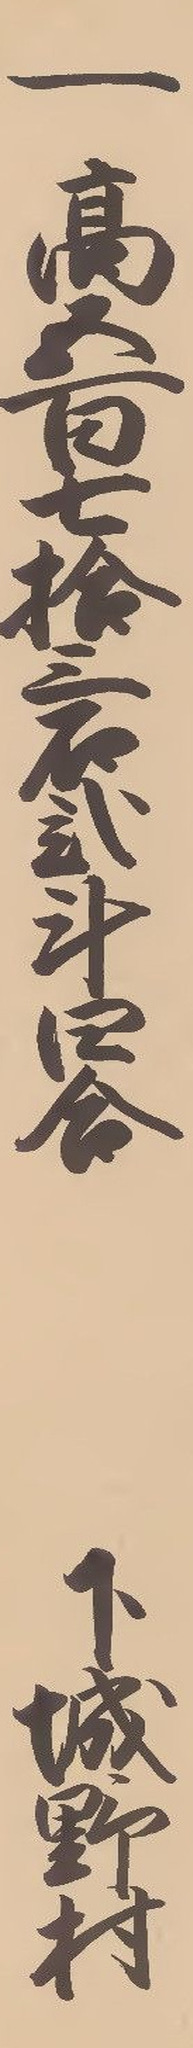一髙五百七拾三石弍斗四合下城野村
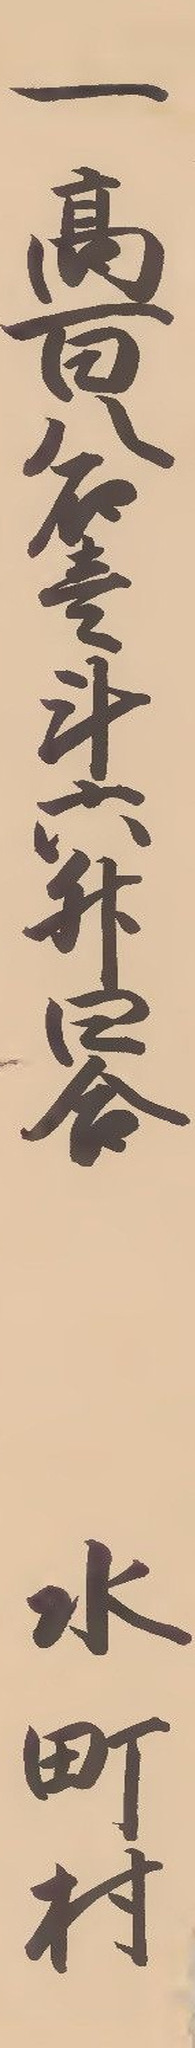一髙百八石壱斗六升四合水町村
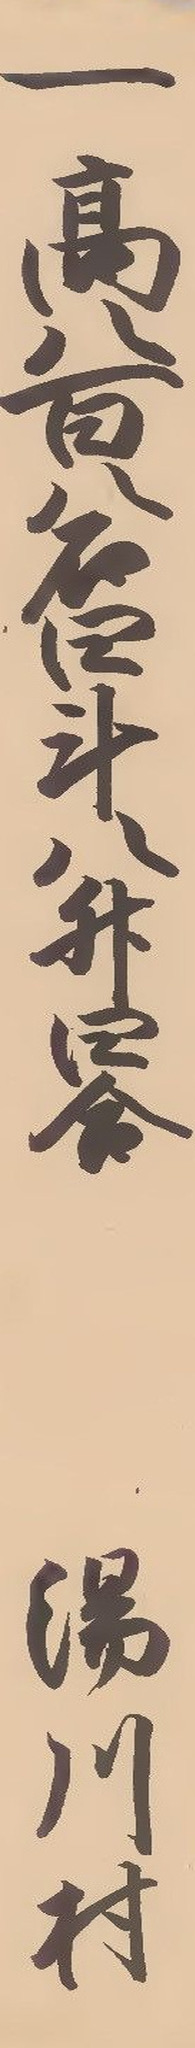一髙八百八石四斗八升四合湯川村
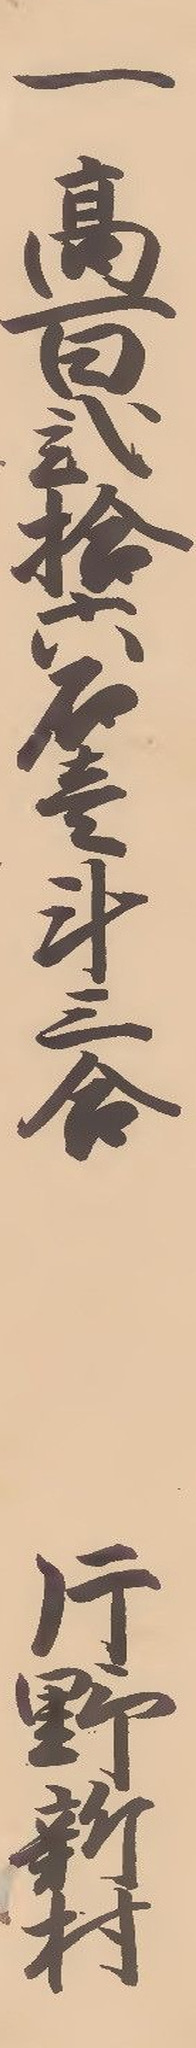一髙百弍拾六石壱斗三合片野新村

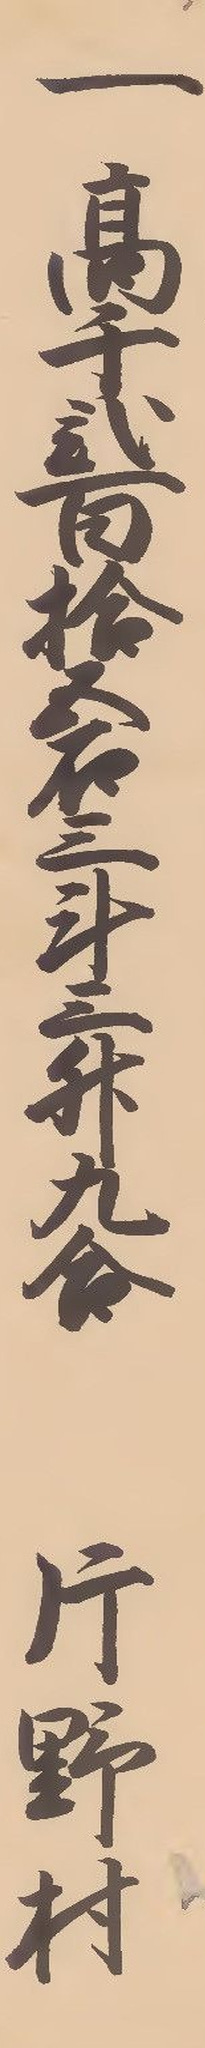一髙千弐百拾五石三斗三升九合片野村
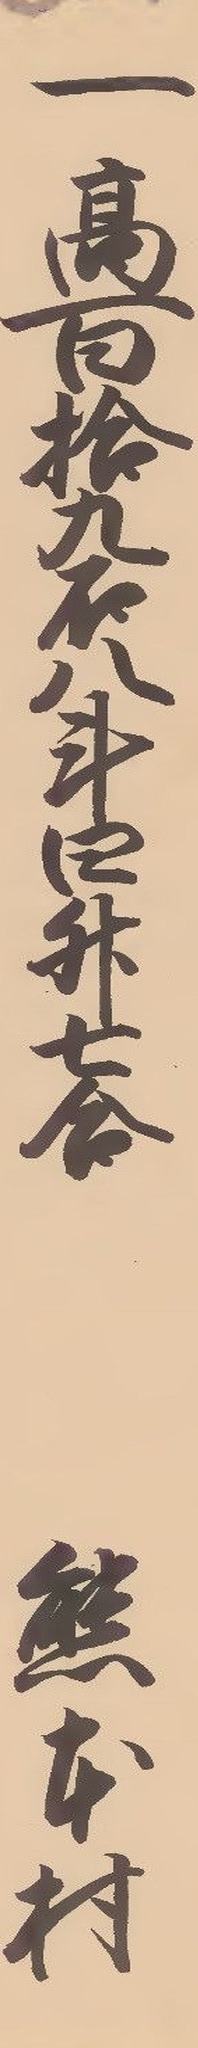一髙百拾九石八斗四升七合熊本村
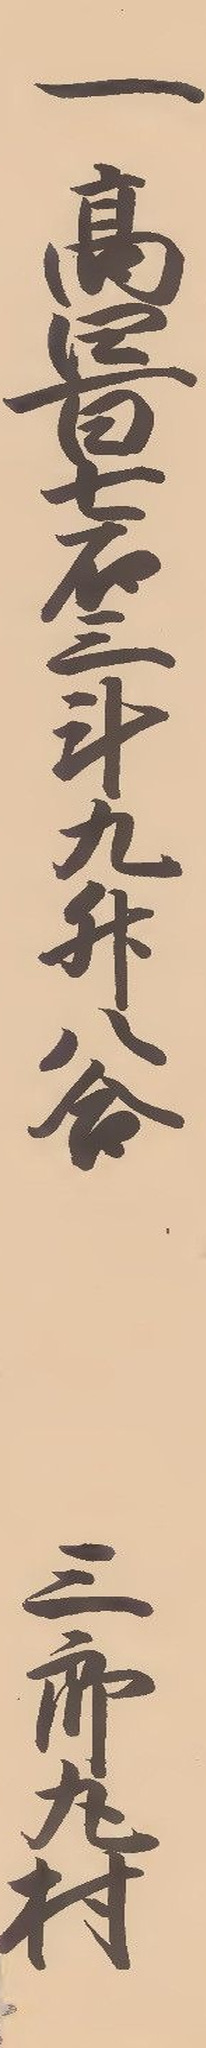一髙四百七石三斗九升八合三郎丸村
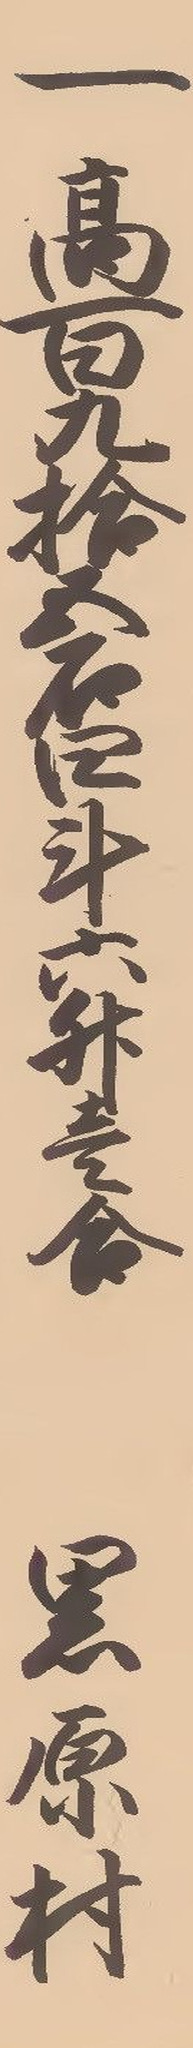一髙百九拾五石四斗六升壱合黑原村
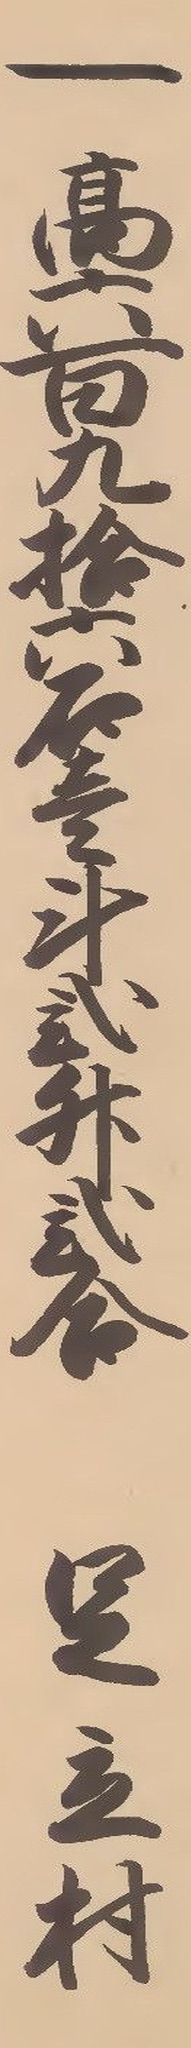一髙六百九拾六石壱斗弐升弐合足立村
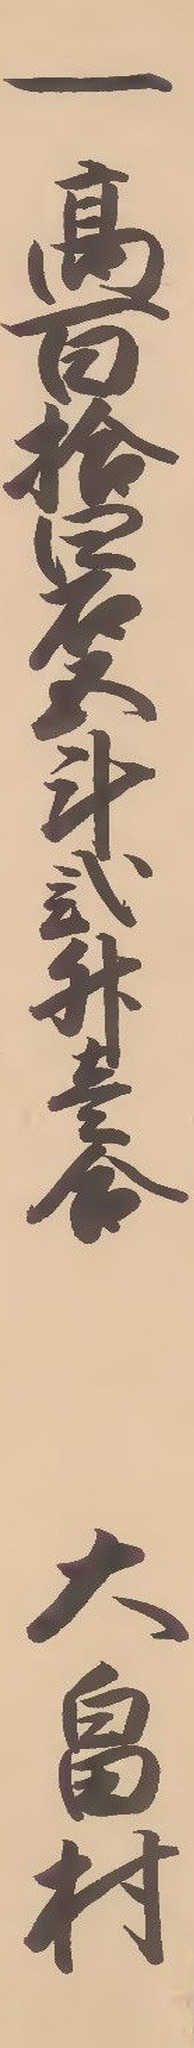一髙百拾四石五斗弐升壱合大畠村
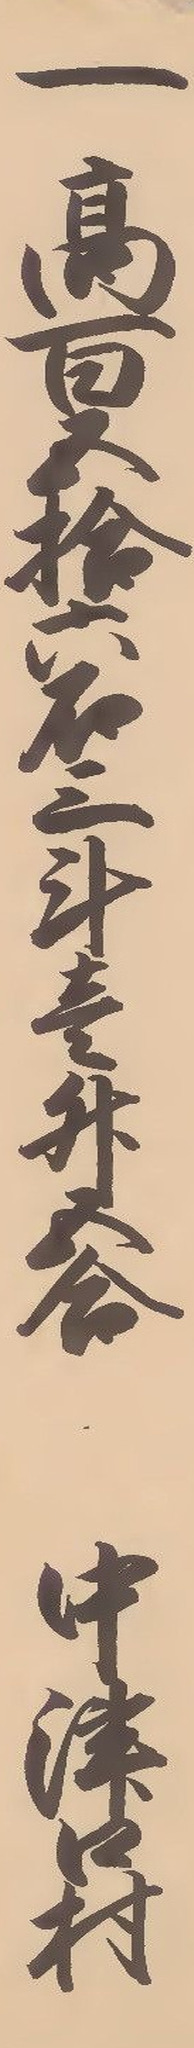一髙百五拾六石三斗壱升五合中津口村
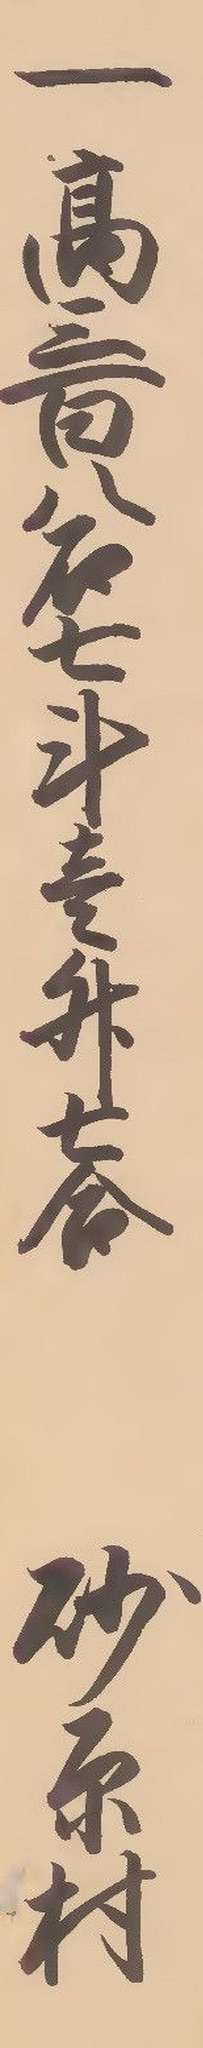一髙三百八石七斗壱升七合砂原村
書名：豊前国郷帳
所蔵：国立公文書館 National Archives of Japan
